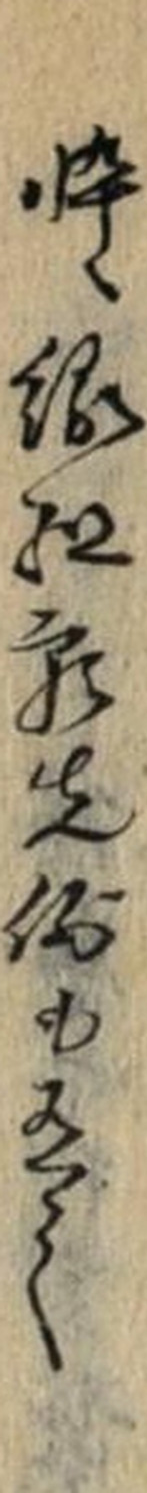悴へ縁組先例も有之
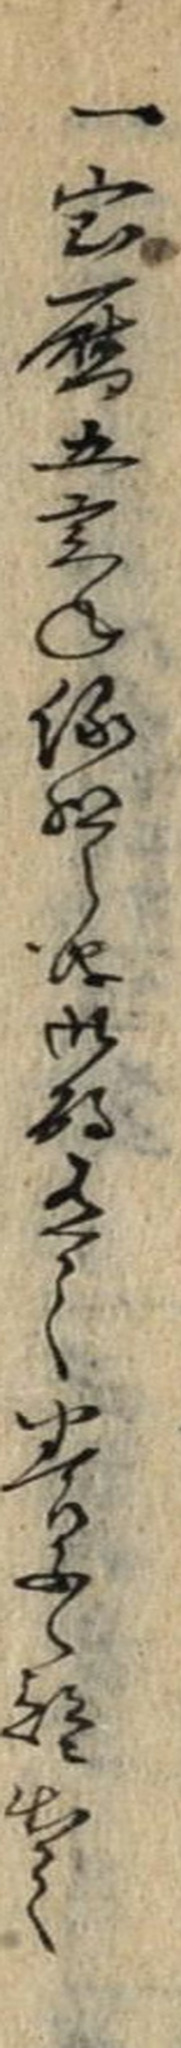一宝暦五亥年縁組之儀御尋有之養子之部に出之
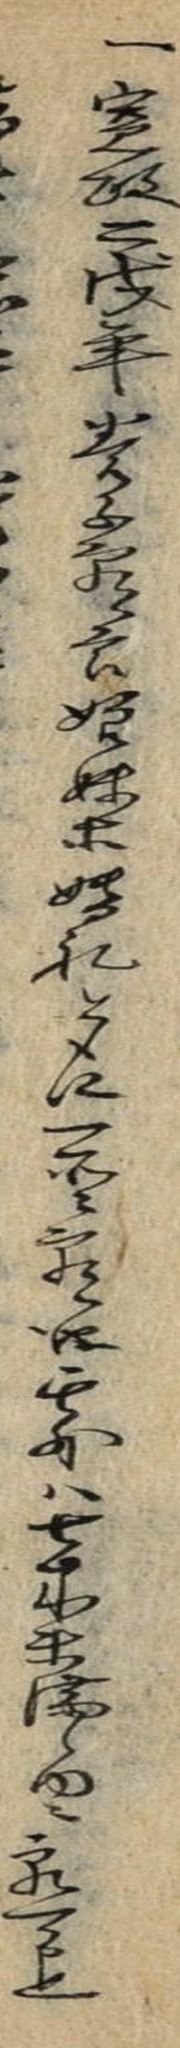一寛政二戌年養子願候節娘妹等婚礼ともに一所に願候儀其外は七歳未満之内に願可申上
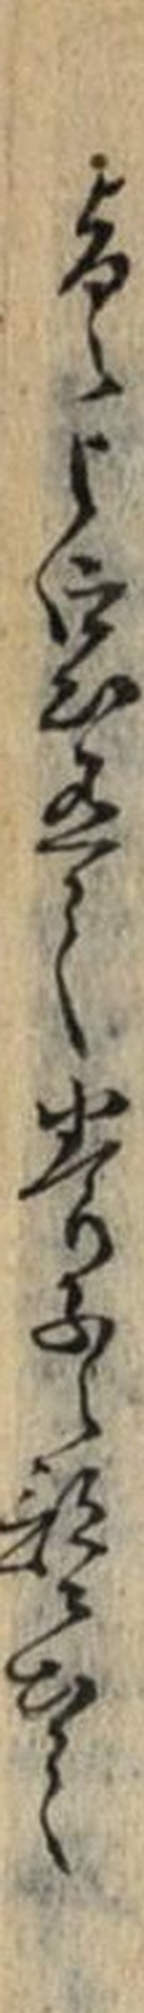旨之被仰出有之養子之部に出之
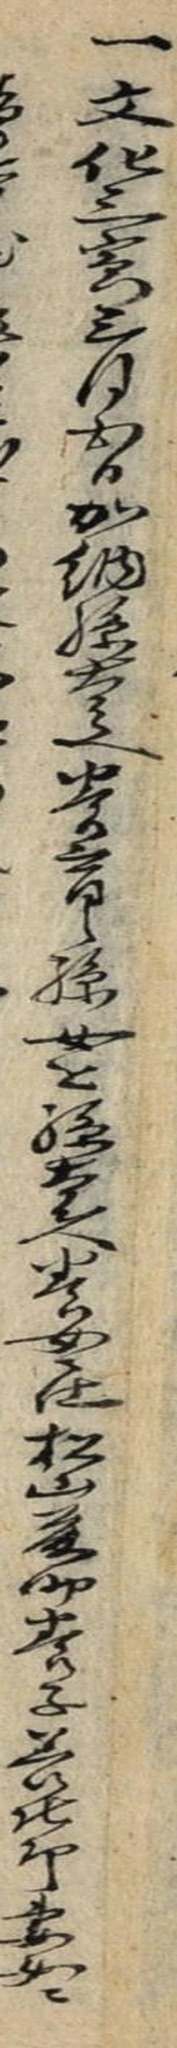一文化三寅三月五日加納孫大夫養育之孫女を孫大夫養女に仕松山藤助養子善次郎妻女に
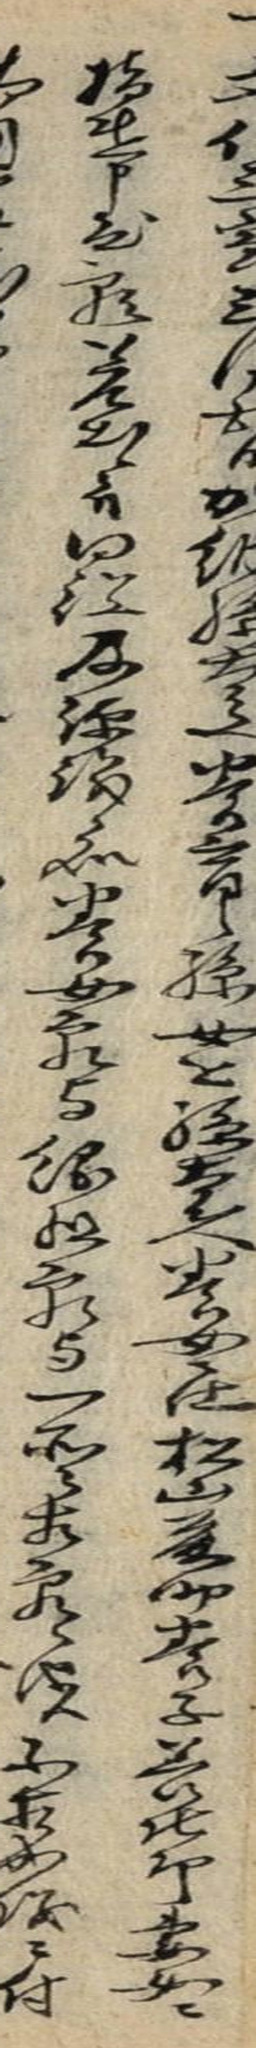指遣申度願差出候に付同役及評議候処養女願と縁組願と一所に相願候儀は不相成儀に付
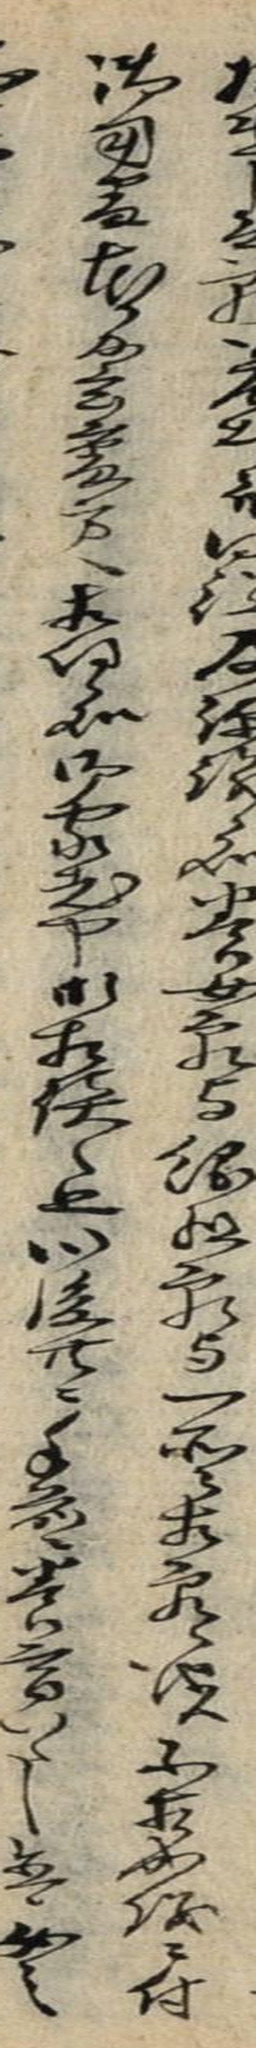御用番本多玄蕃方へ相伺候処御家老中御相談之上以後共に手前に養育いたし置候女之
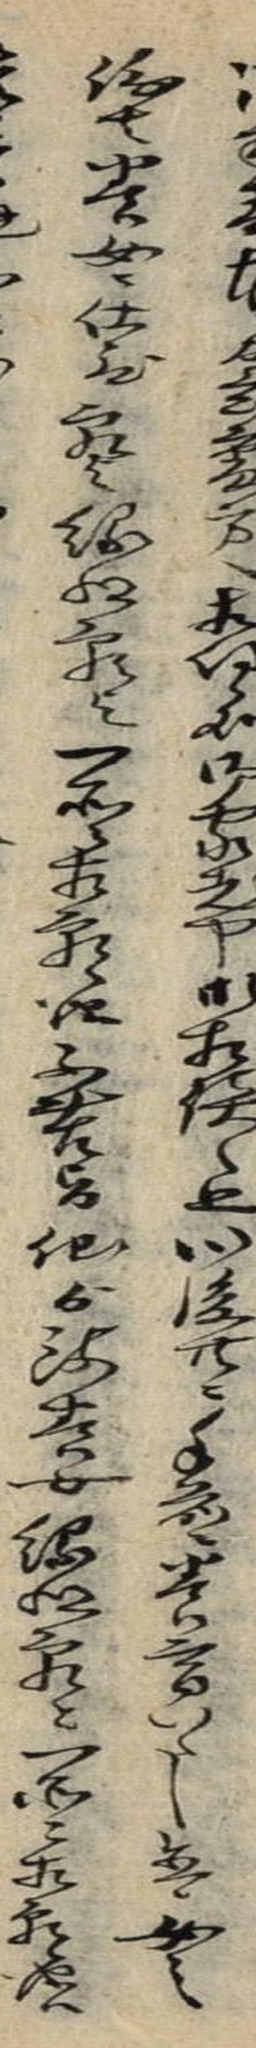儀は養女に仕度願と縁組願と一所に相願候儀不苦旨他ゟ致養女縁組願と一所に相願候儀は
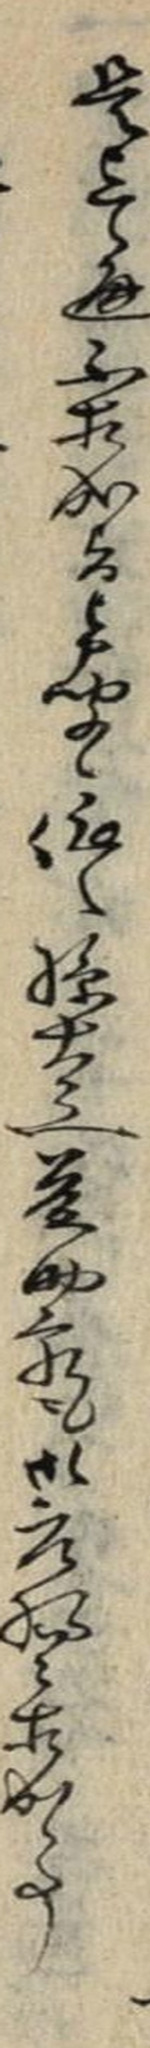是迄之通不相成旨被申聞候依之孫太夫藤助願も御取揚に相成候事
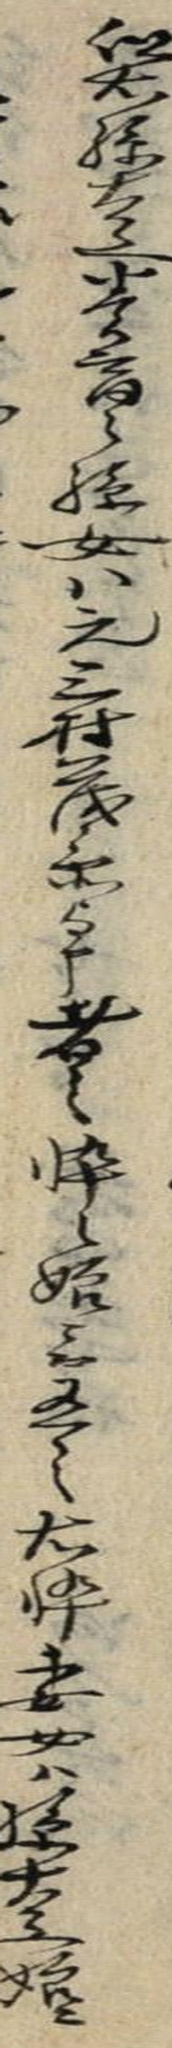但右孫太夫養育之孫女は元三村茂兵衛と申者之悴之娘に而有之右悴之妻女は孫太夫娘に
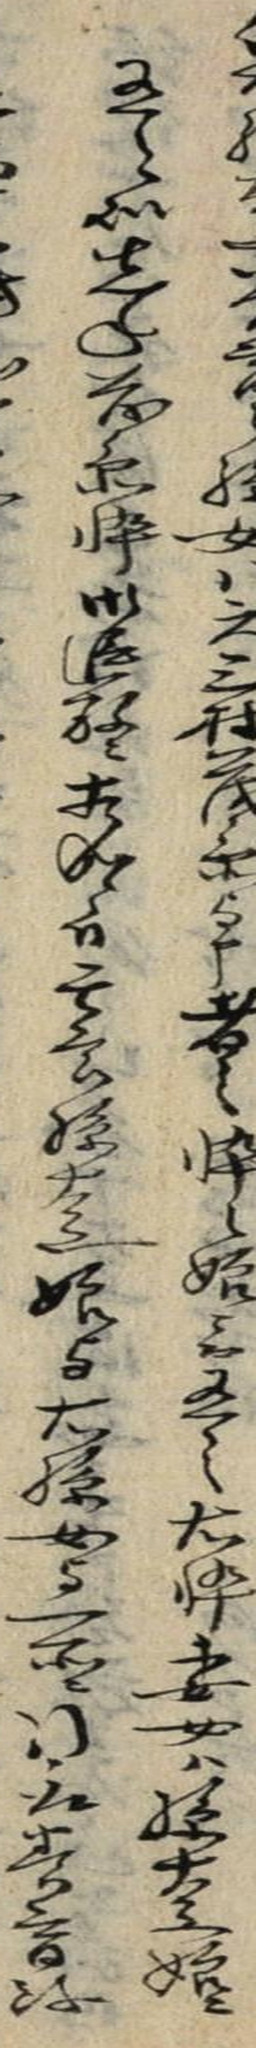有之候処先年茂兵衛悴御追放に相成候に付其節孫太夫娘と右孫女と一所に引取養育致
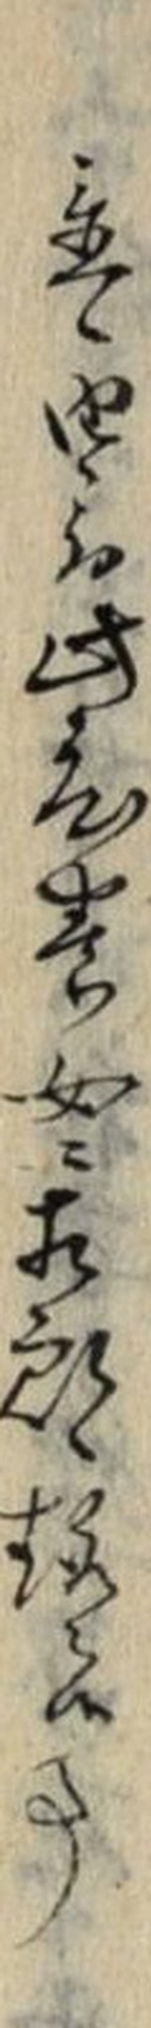置候由に而此度養女に相願候趣に候事
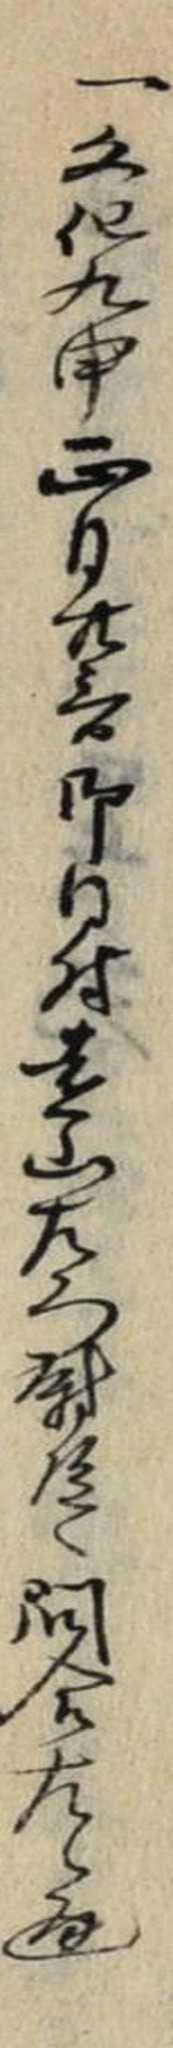一文化九申正月廿三日御日付遠山左衛門尉殿問合左之通
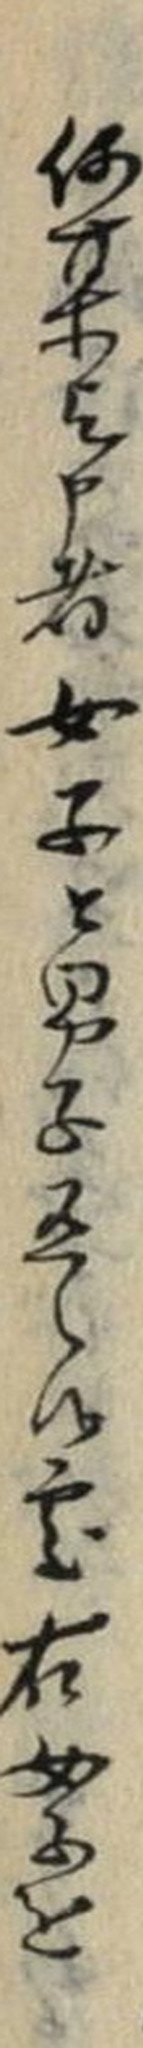何某と申者女子と男子有之候処女子を
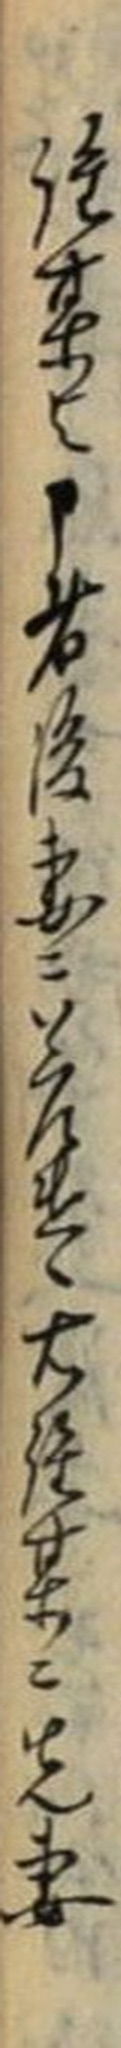誰某と申者ご後妻に差遣候右誰某に先妻
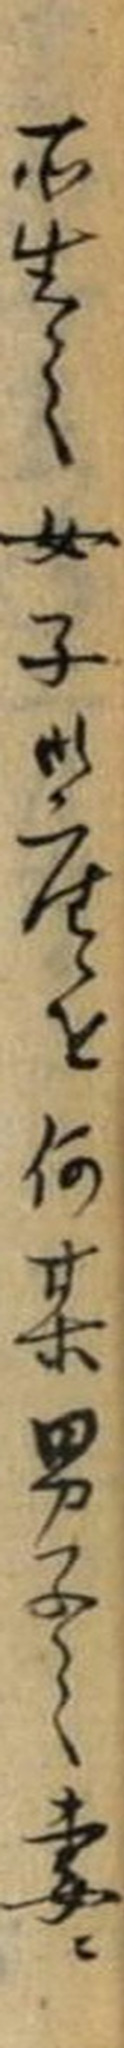所生之女子御座候を何某男子之妻に
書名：養子縁組之部
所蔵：福井県文書館 Fukui Prefectural Archives
